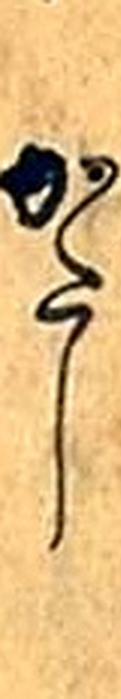かたし
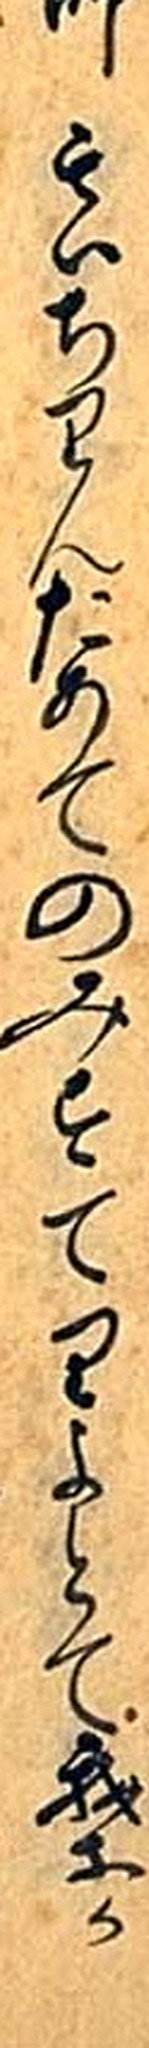師其はちりんたあてのみすてりよとて我等か
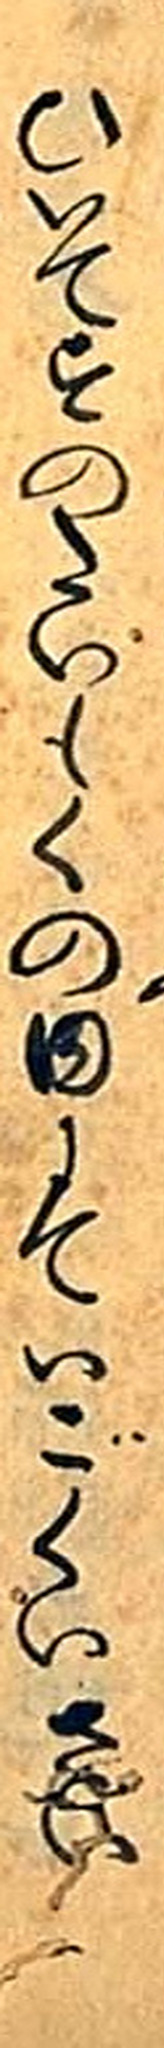ひいてすのたいもくの内にてはごくいさい
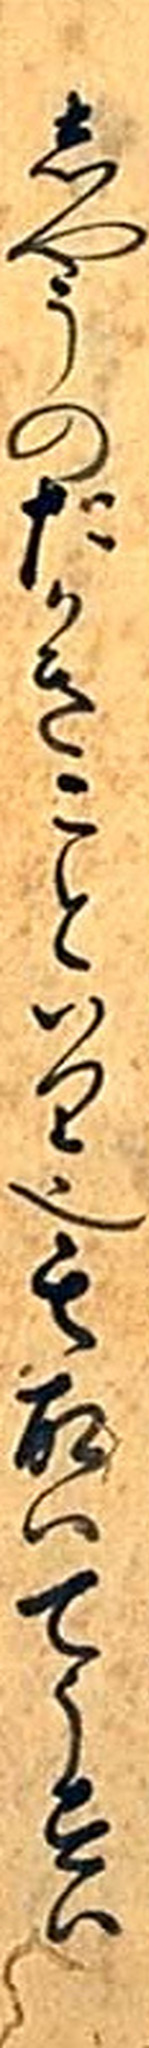しやうのたかきことはり也其故はてうすは
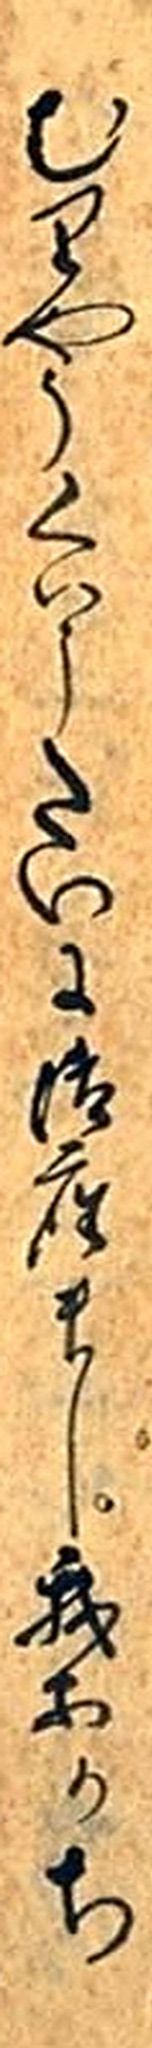むりやうくはうたいに御座まし我等かち
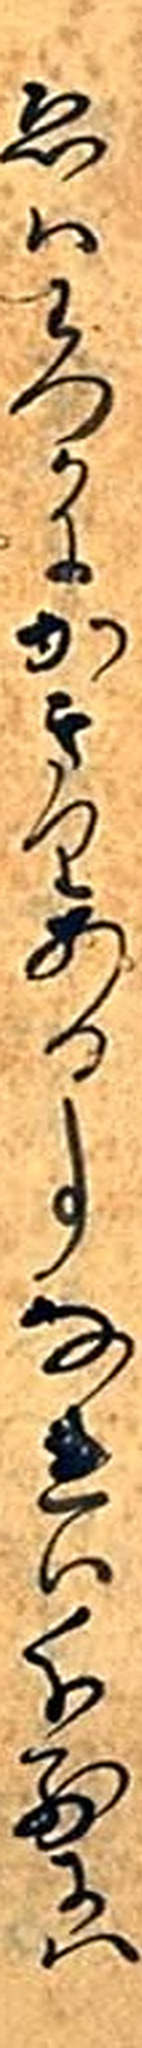ゑはわつかにかきりある事なれは分別には
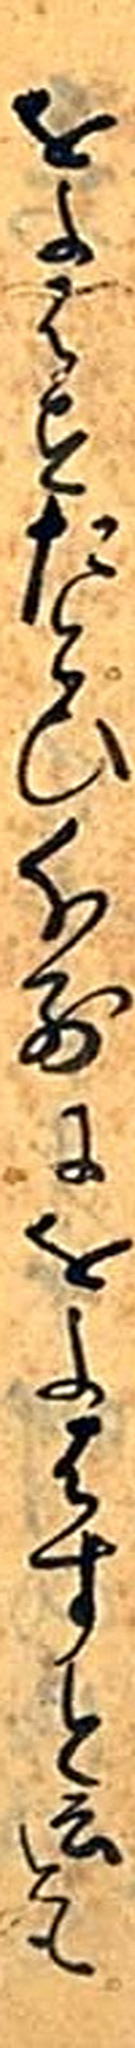をよはすたとひ分別にをよはすと云とも
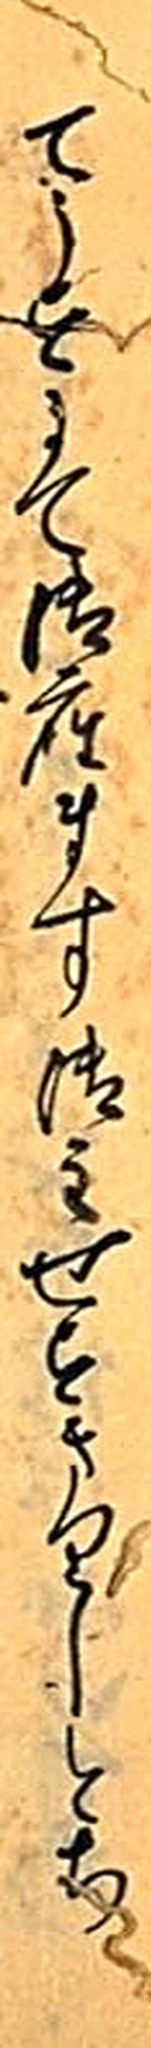てうすにて御座ます御主せすきりしとち
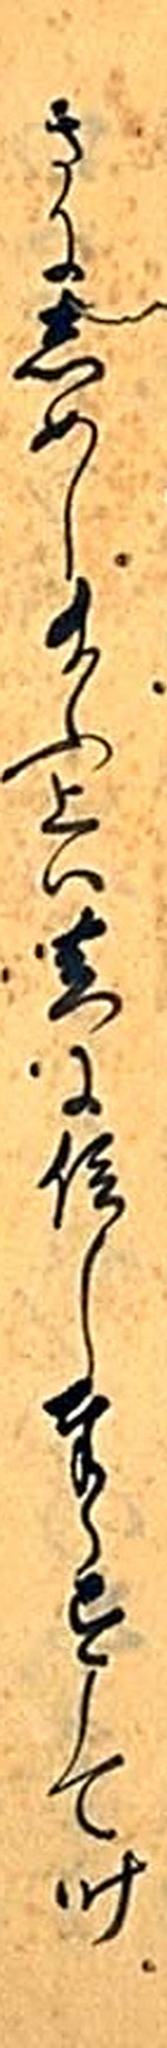きにしめし給ふ上は真に信し奉らすして叶
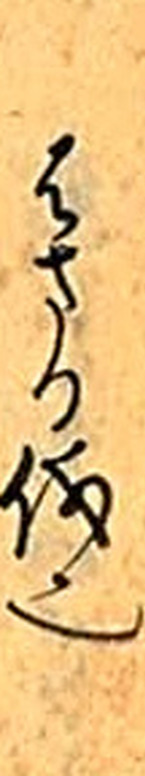はさる儀也
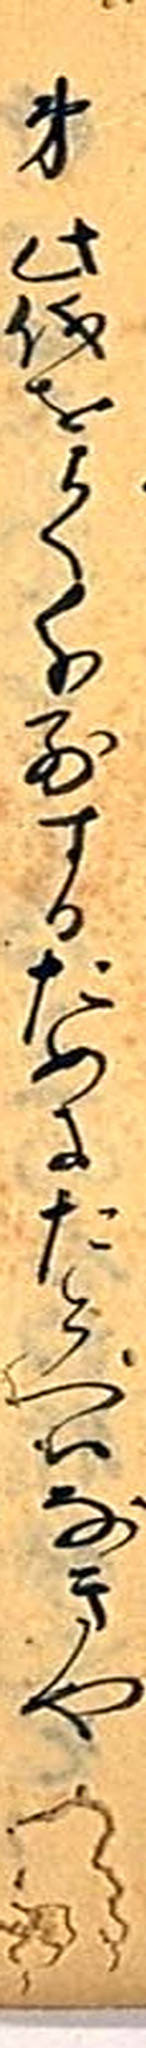弟此儀をよく分別するためにたとへはなきや
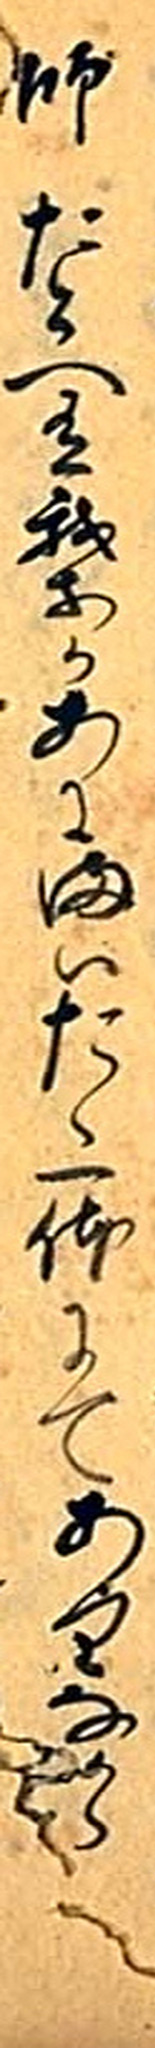師たとへ有我等かあにまはたゝ一体にてありなから
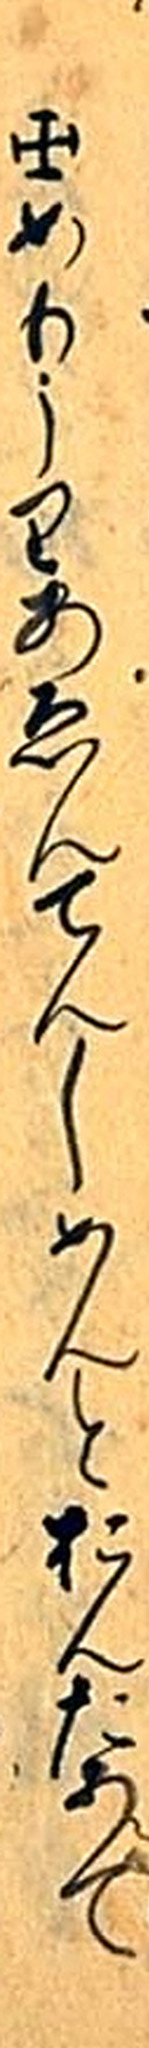☩めもうりあゑんてんしめんとおんたあて
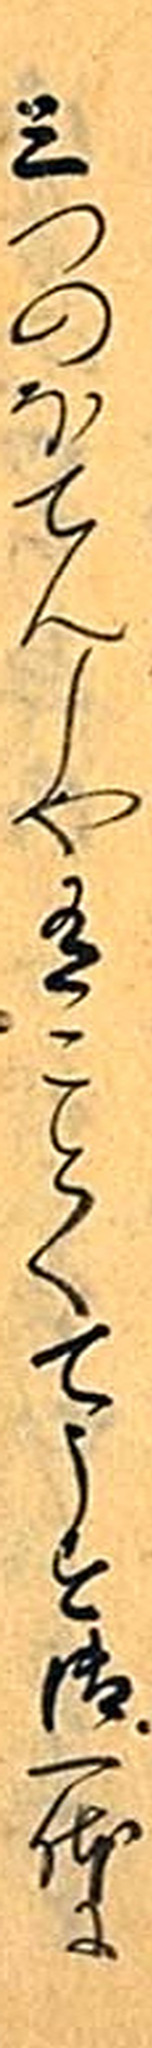三つのほてんしや有ことくてうす御一体に
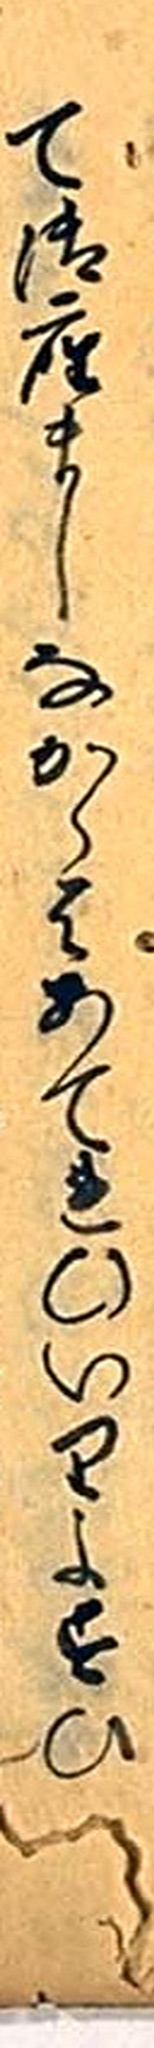て御座ましなからはあてれひいりよすひ
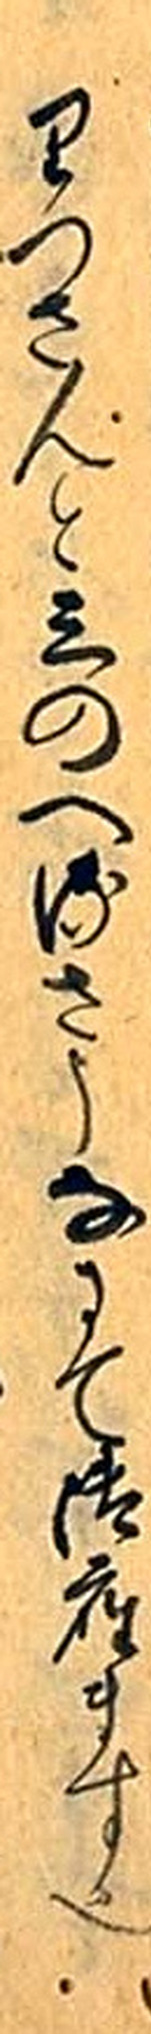りつさんと三のへるさうなにて御座ます也
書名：ドチリナ・キリシタン
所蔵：東京大学総合図書館 / General Library in the University of Tokyo
